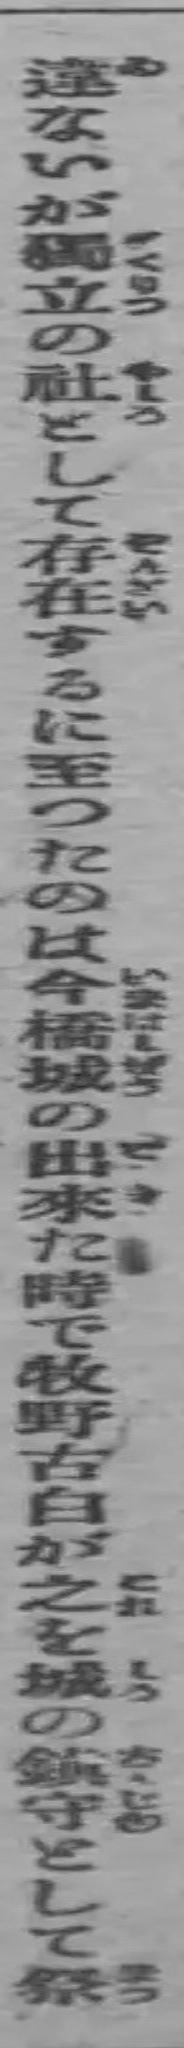違ないが独立の社として存在するに至つたのは今橋城の出来た時で牧野古白は之を城の鎮守として祭
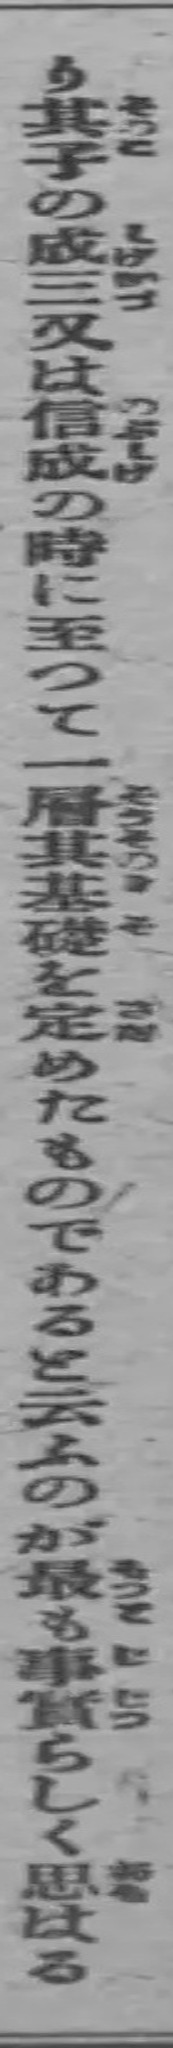り其子の成三又は信成の時に至つて一層其基礎を定めたものであると云ふのが最も事実らしく思はる
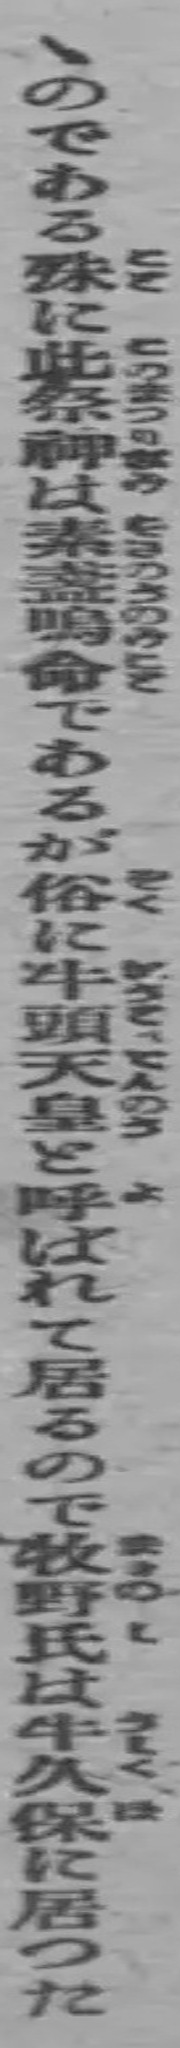ゝのである殊に此祭神は素戔嗚尊であるが俗に牛頭天皇と呼ばれて居るので牧野氏は牛久保に居つた
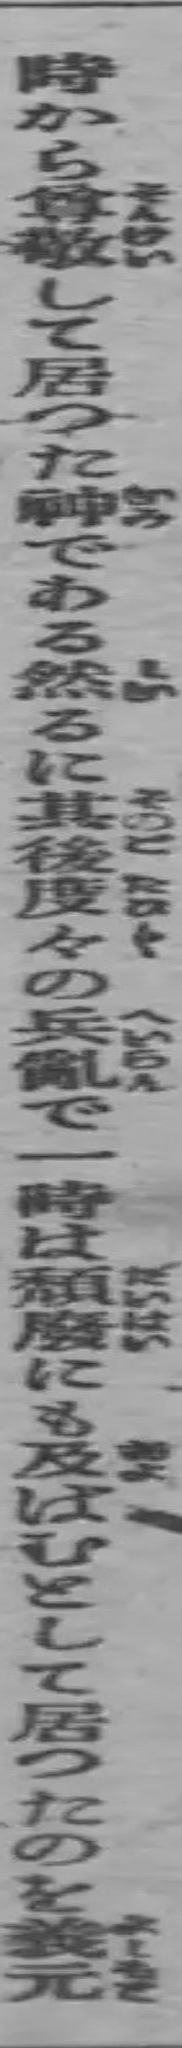時から尊敬して居つた神である然るに其後度々の兵乱で一時は頽廃にも及ばむとして居つたのを義元
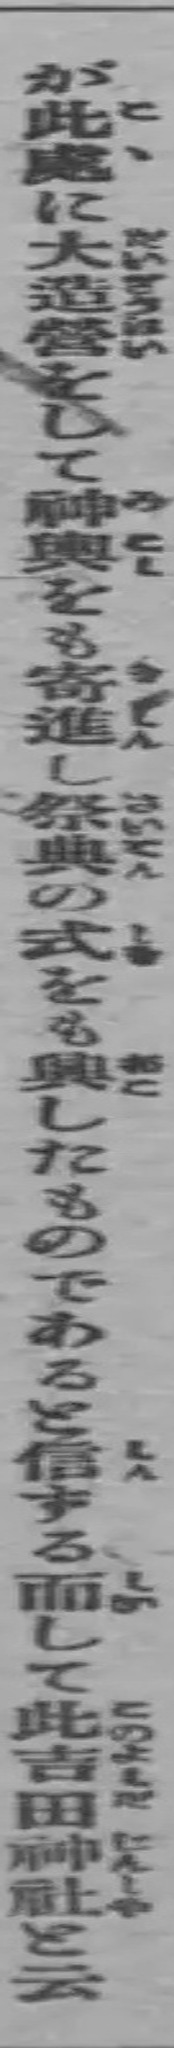が此処に大造営をして神輿をも寄進し祭典の式をも興したものであると信ずる而して此吉田神社と云
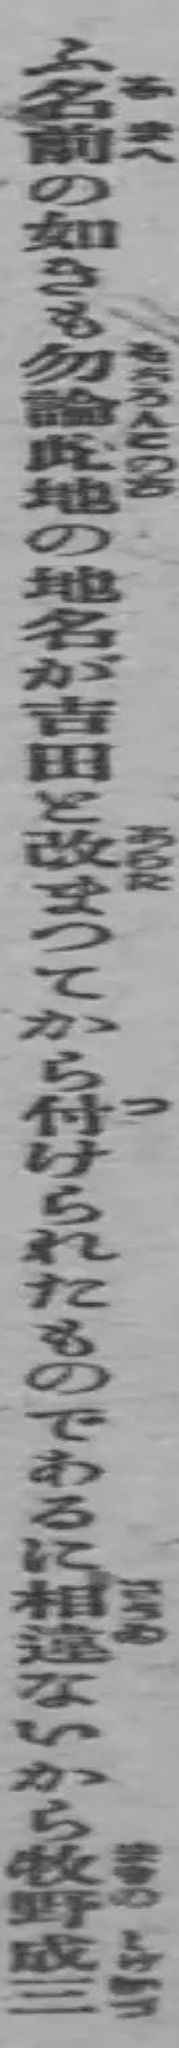ふ名前の如きも勿論此地の地名が吉田と改まつてから付けられたものであるに相違ないから牧野成三
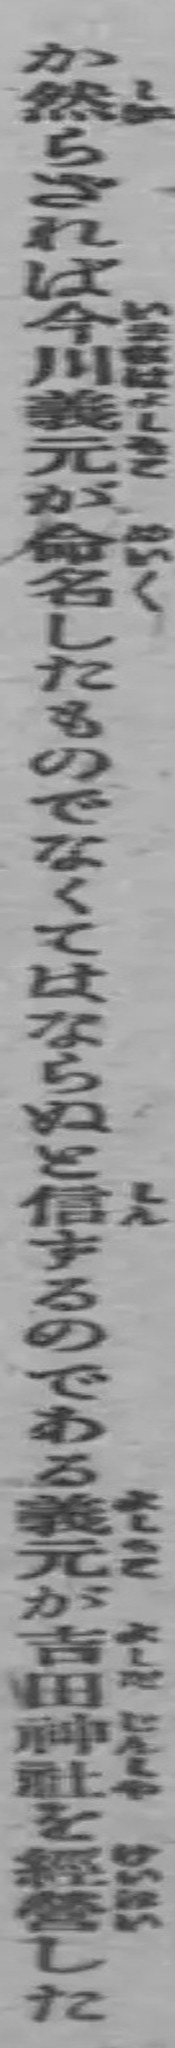か然らざれば今川義元が命名したものでなくてはならぬと信ずるのである義元が吉田神社を経営した
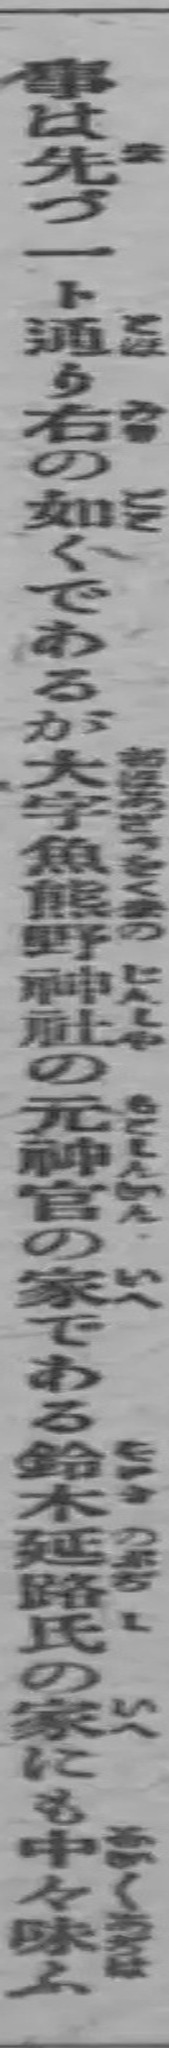熊野神社事は先づ一ト通り右の如くであるが大字魚熊野神社の元神官の家である鈴木延路氏の家にも中々味ふ
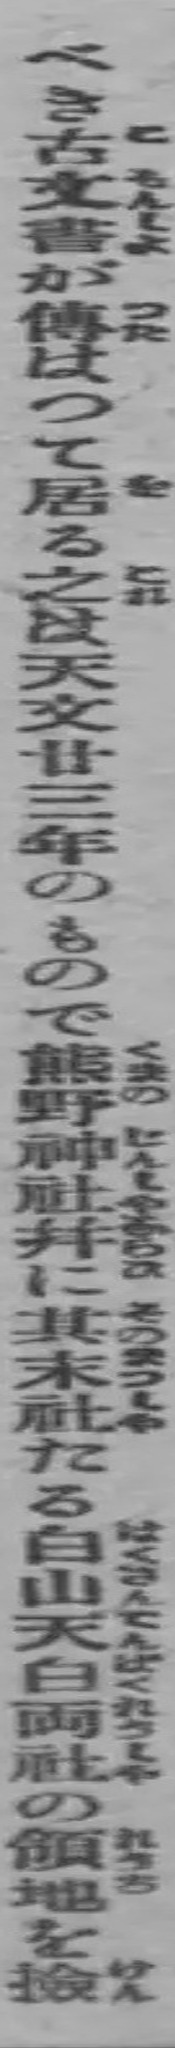べき古文書が伝はつて居る之は天文廿三年のもので熊野神社幷に其末社たる白山天白両社の領地を撿
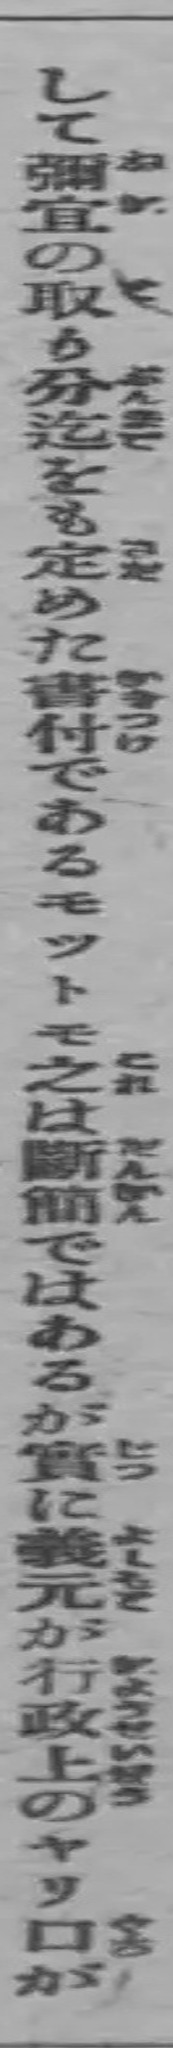して禰宜の取り分迄をも定めた書付であるモツトモ之は断簡ではあるが実に義元が行政上のヤリ口が
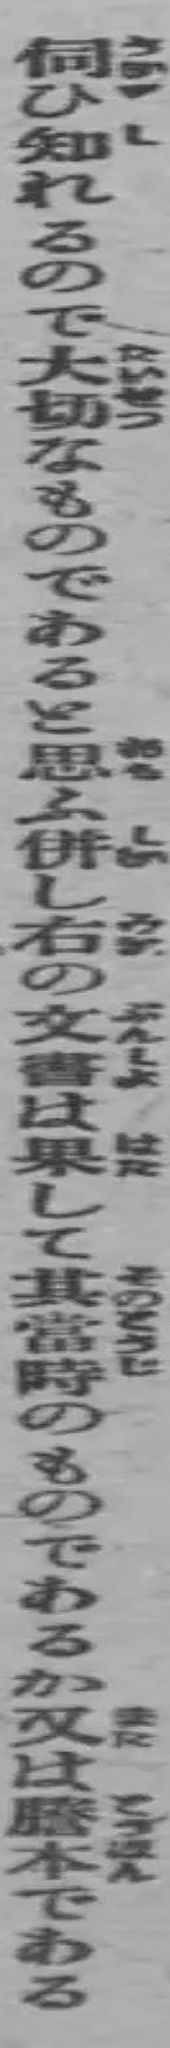伺ひ知れるので大切なものであると思ふ併し右の文書は果して其当時のものであるか又は謄本である
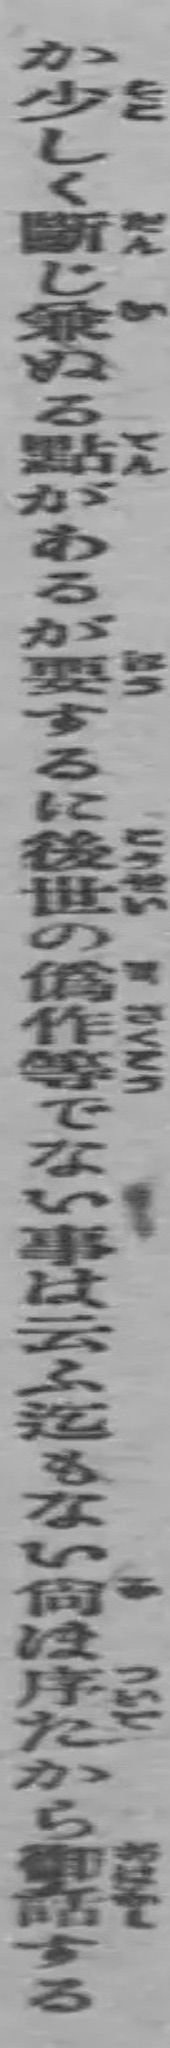か少しく断じ兼ぬる点があるが要するに後世の偽作等でない事は云ふ迄もない尚ほ序たから御話する
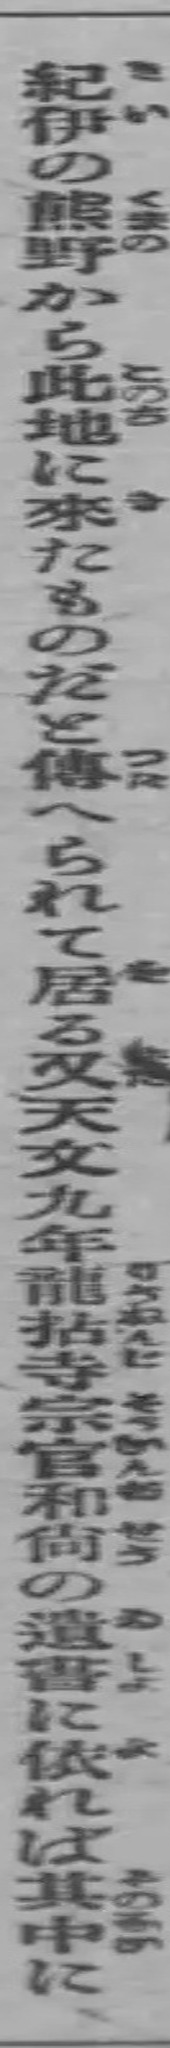紀伊の熊野から此地に来たものだと伝へられて居る又天文九年龍拈寺宗官和尚の遺書に依れば其中に
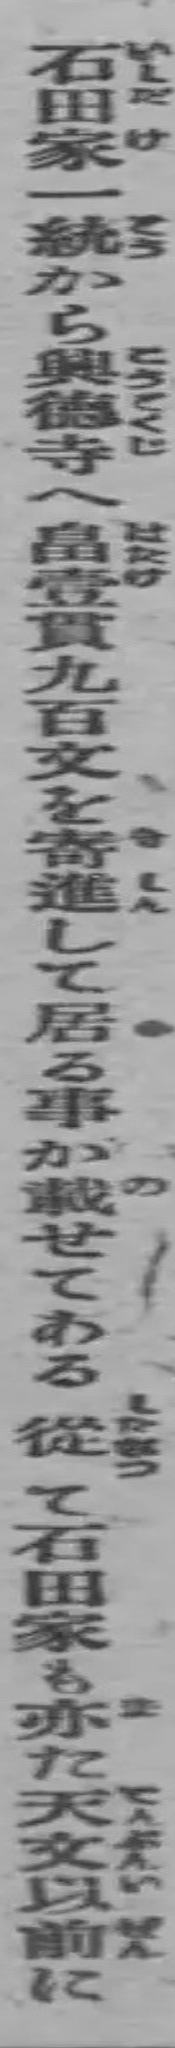石田家一統から興徳寺へ畠壱貫九百文を寄進して居る事か載せてある従て石田家も亦た天文以前に
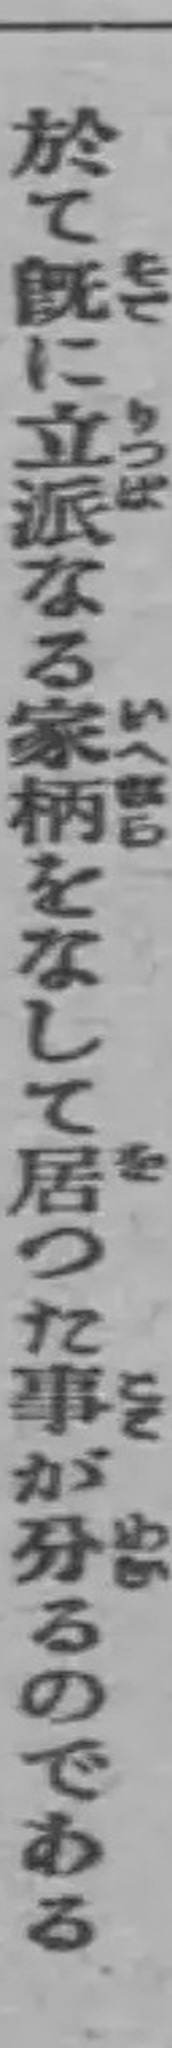於て既に立派なる家柄をなして居つた事が分るのである
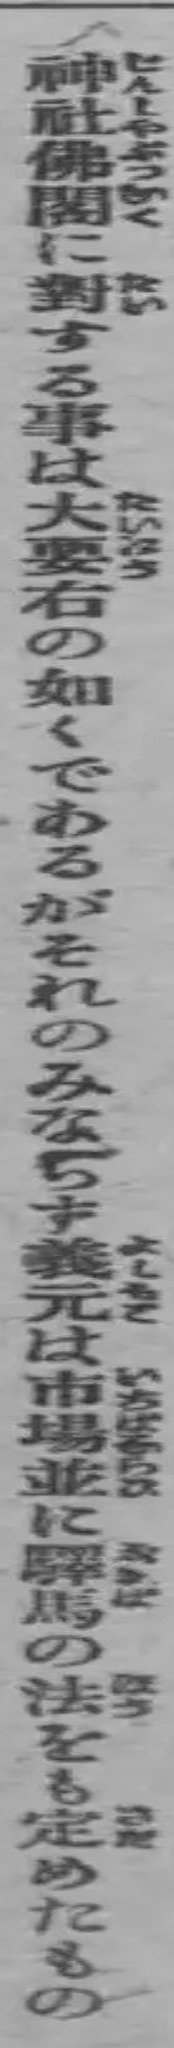神社仏閣に対する事は大要右の如くであるがそれのみならず義元は市場並に駅馬の法をも定めたもの
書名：豊橋市史談
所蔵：国立国会図書館 National Diet Library, JAPAN
